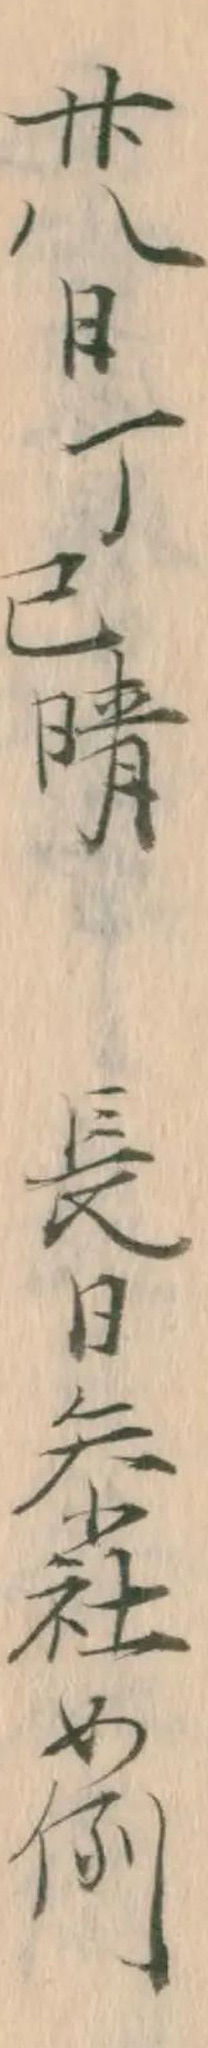廿八日丁巳晴長日参社如例
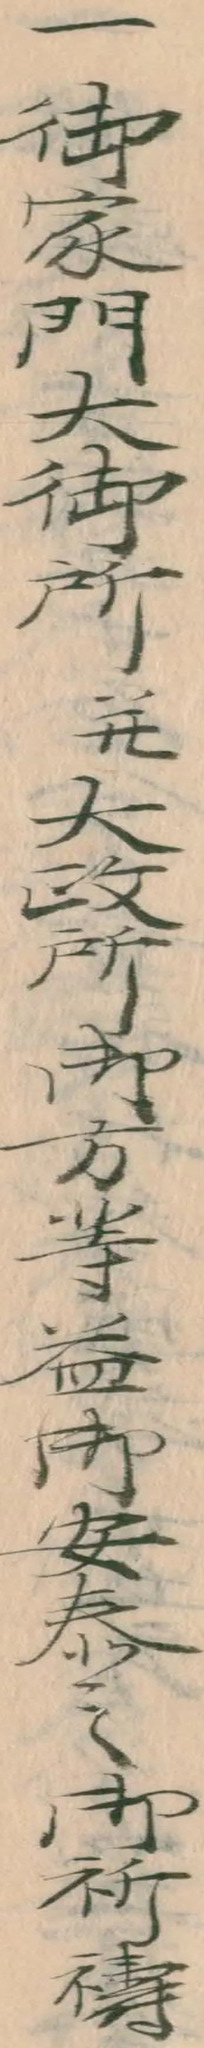一御家門大御所并大政所御方等益御安泰之御祈祷
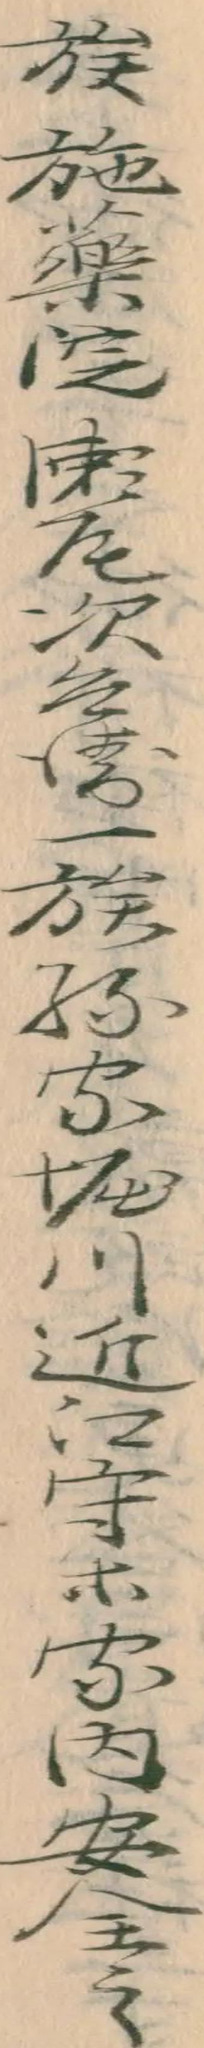族施薬院瀬尾次兵衛一族孫家堀川近江守等家内安全之
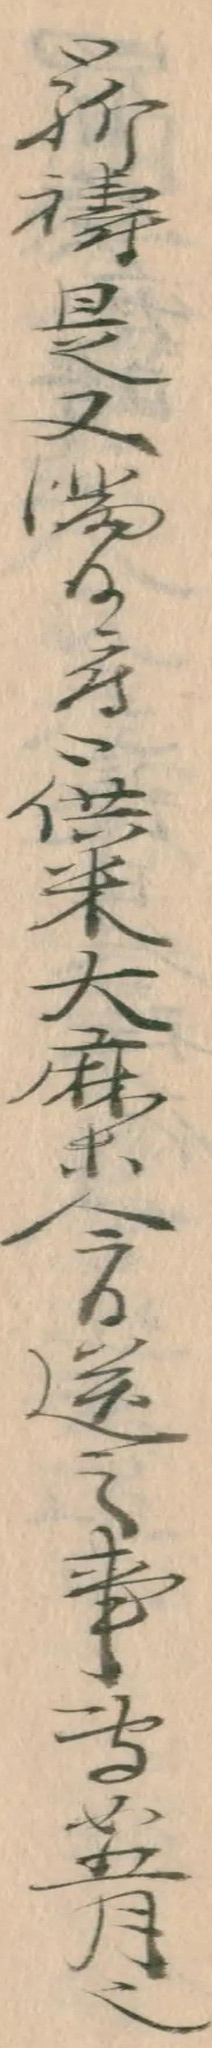御祈祷是又満日ニ付御供米大麻等今日送之事専如五月也
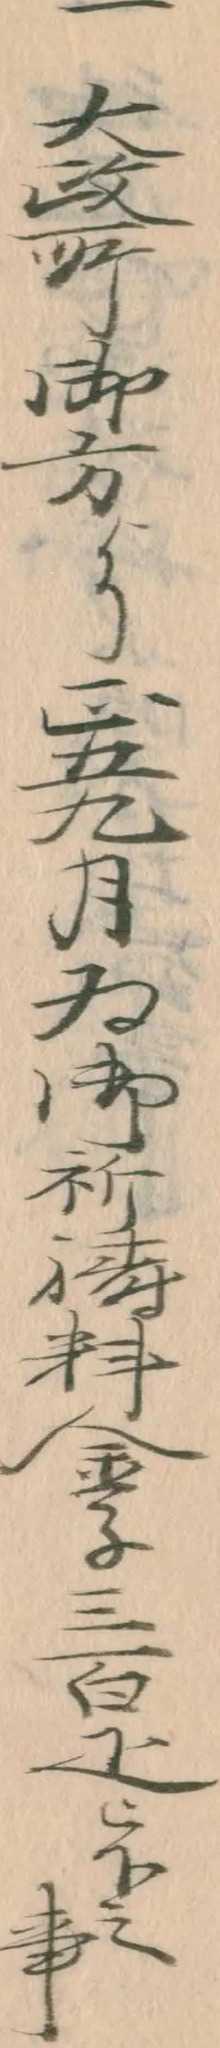一大政所御方より正五九月為御祈祷料金子三百疋被下之事
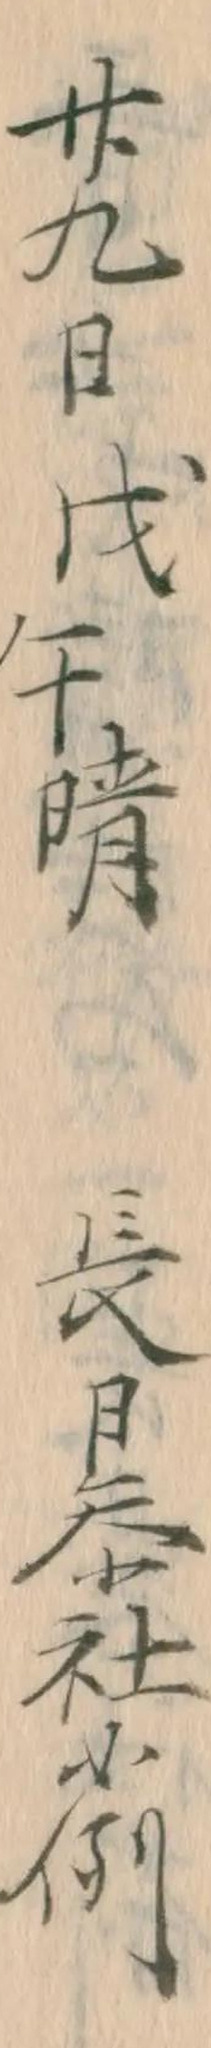廿九日戊干晴長日参社小例
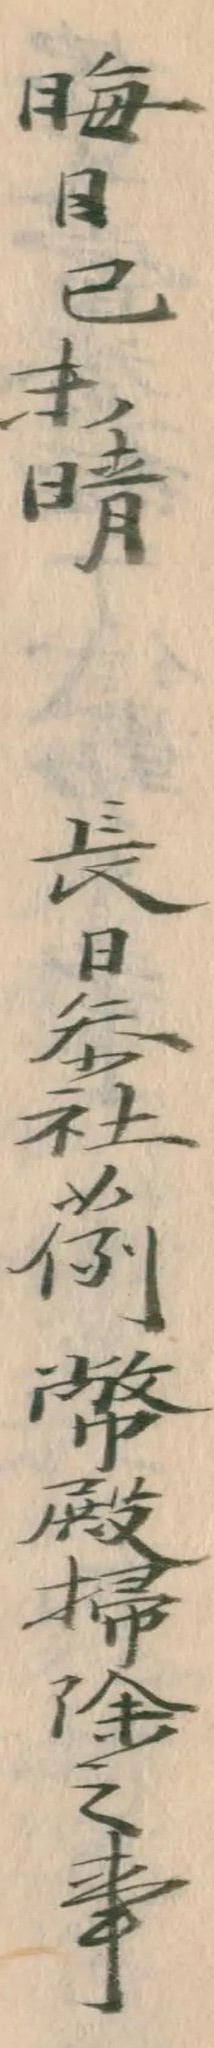晦日己未晴長日参社小例幣殿掃除之事
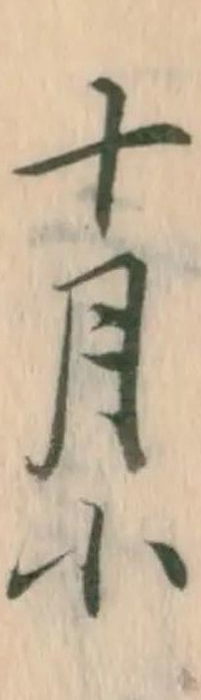十月小
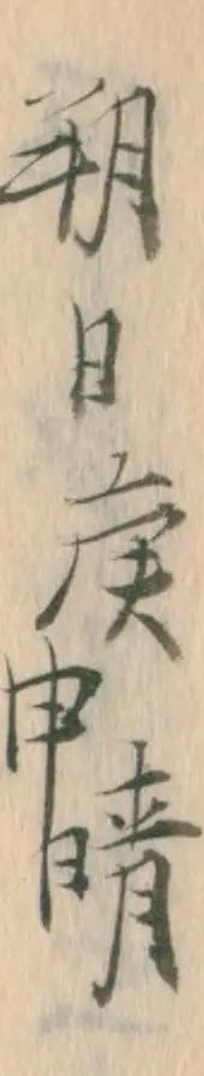朔日庚申晴
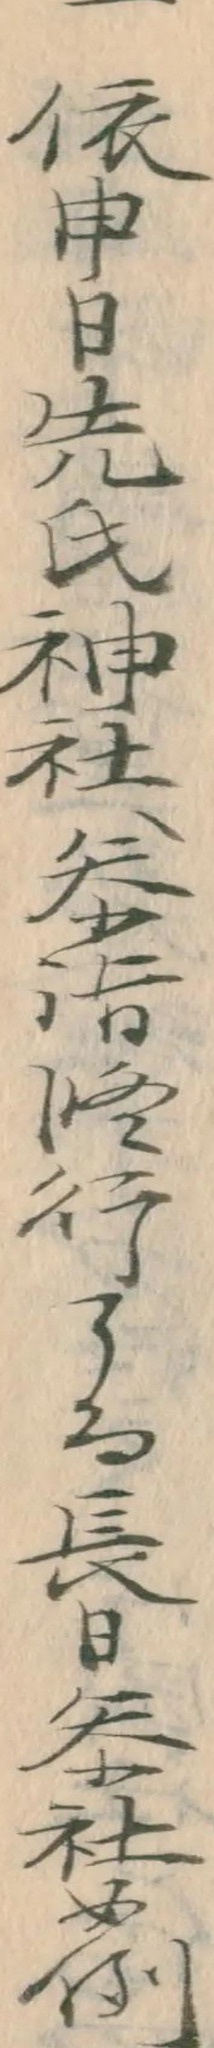一依申日先氏神社へ参詣修行了而長日参社如例
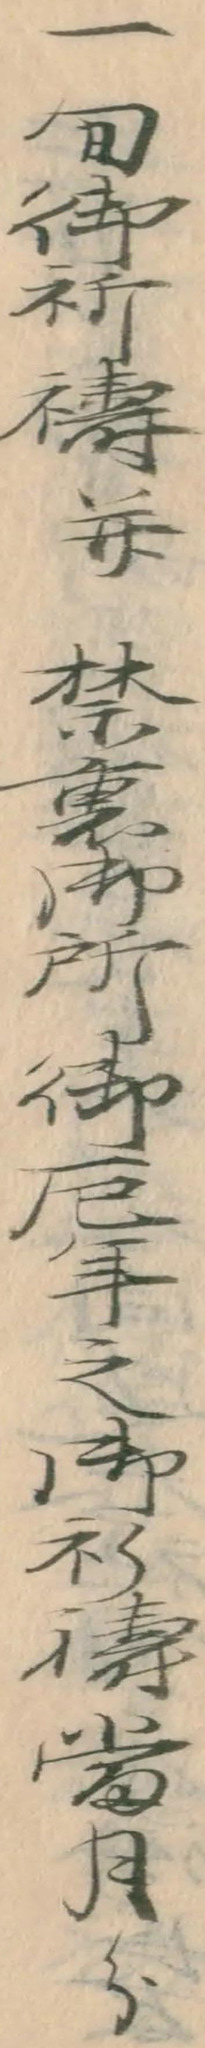一旬御祈祷并禁裏御所御厄年之御祈禱當月分

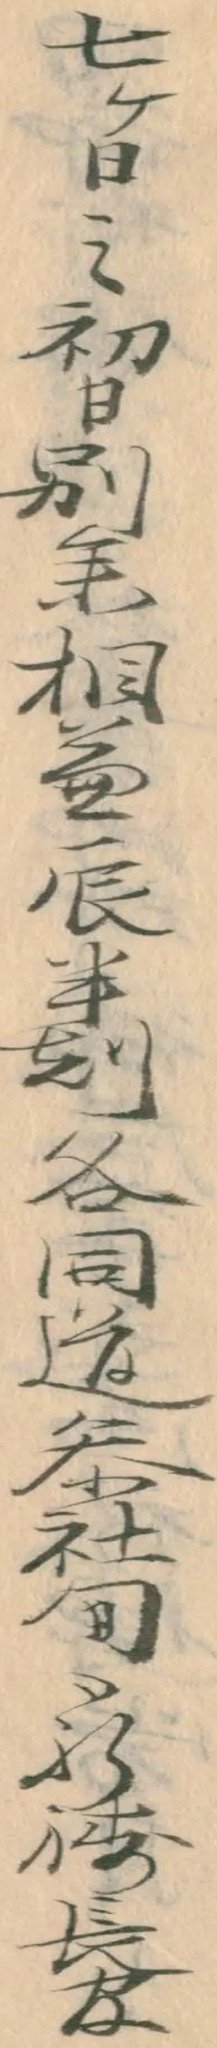七ケ日之初日別参相兼辰半刻各同道参社旬御祈祷長官
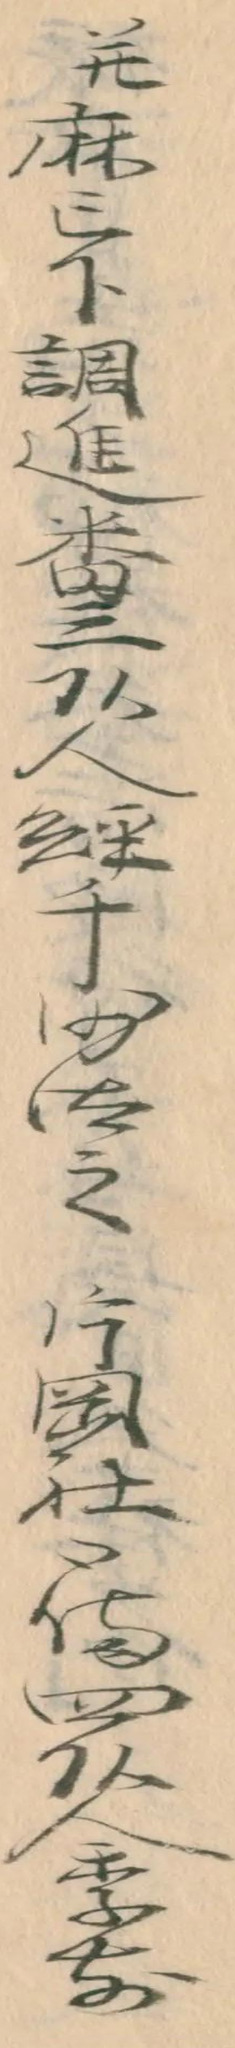并麻上下調進番三頭人経千沙汰之片岡社御備四万人季前
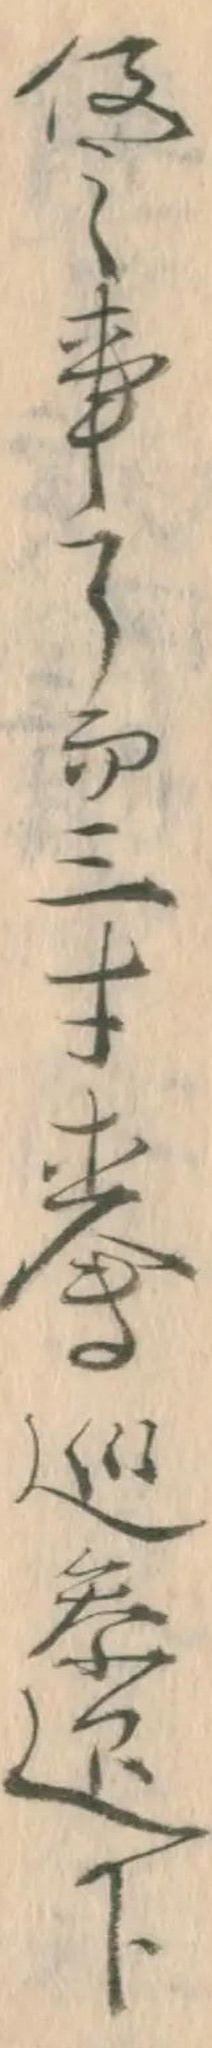役之事了而三寸直會巡参退下
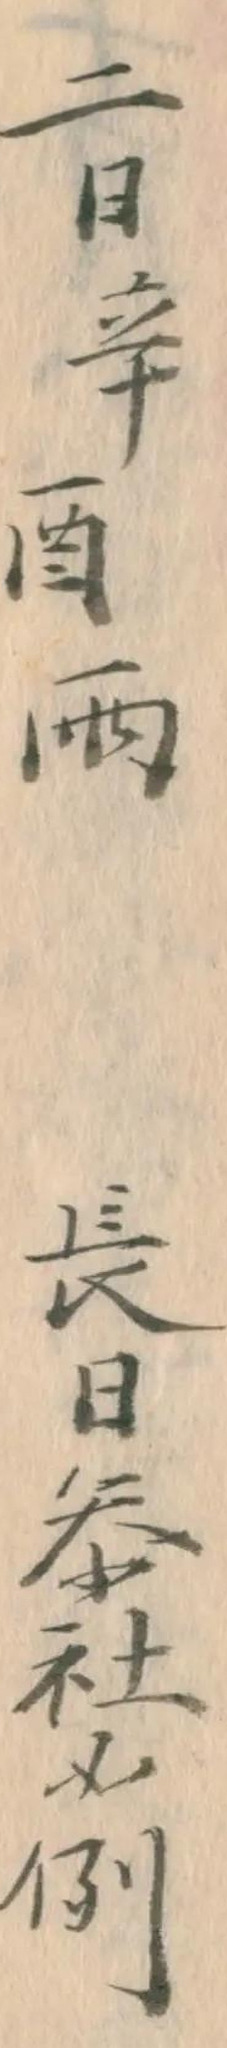二日辛酉雨長日参社如例
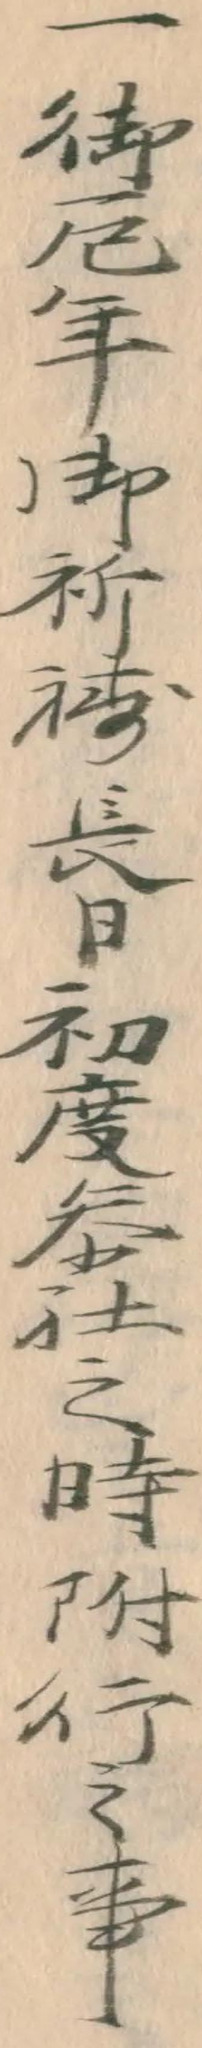一御厄年御祈祷長日初度参社之時附行之事
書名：賀茂社記録. 第74冊
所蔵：国立国会図書館 National Diet Library, JAPAN
